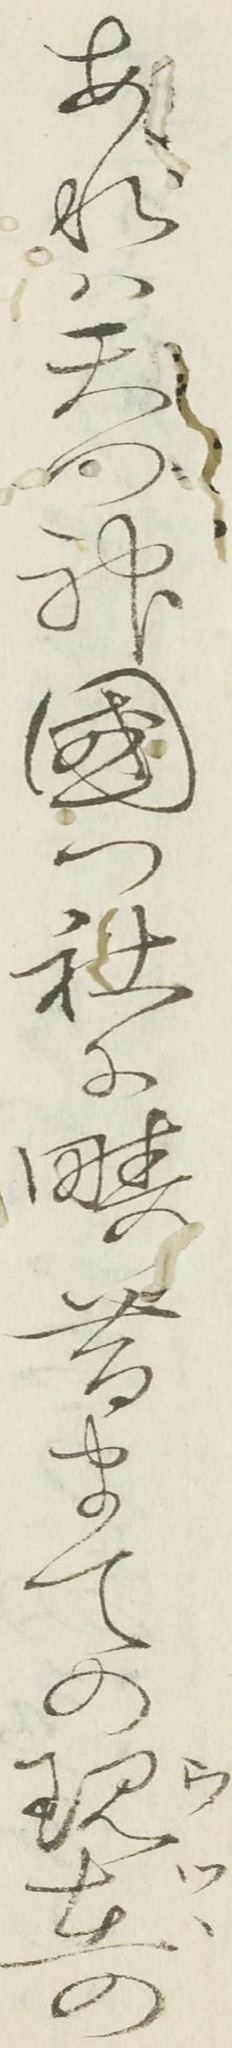あれは天つ神国つ社に疇昔まての現在の
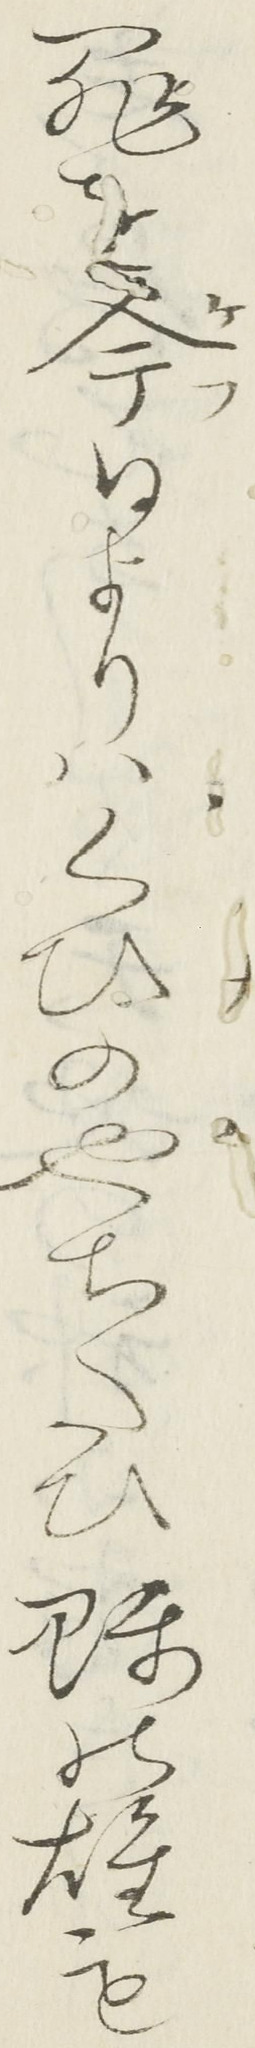罪を今日よりはくひのやちたひの雄も
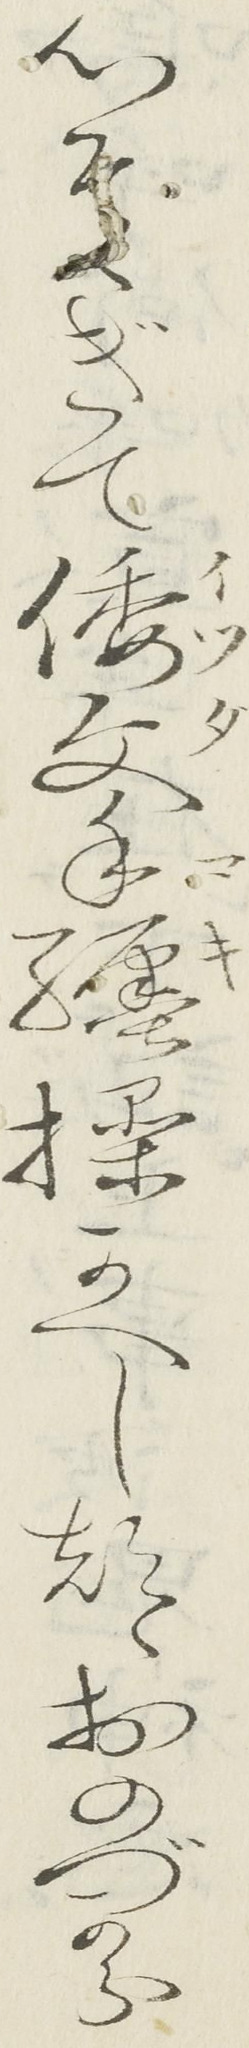心そゝぎて倭文手纏操かへしつゝおのづから
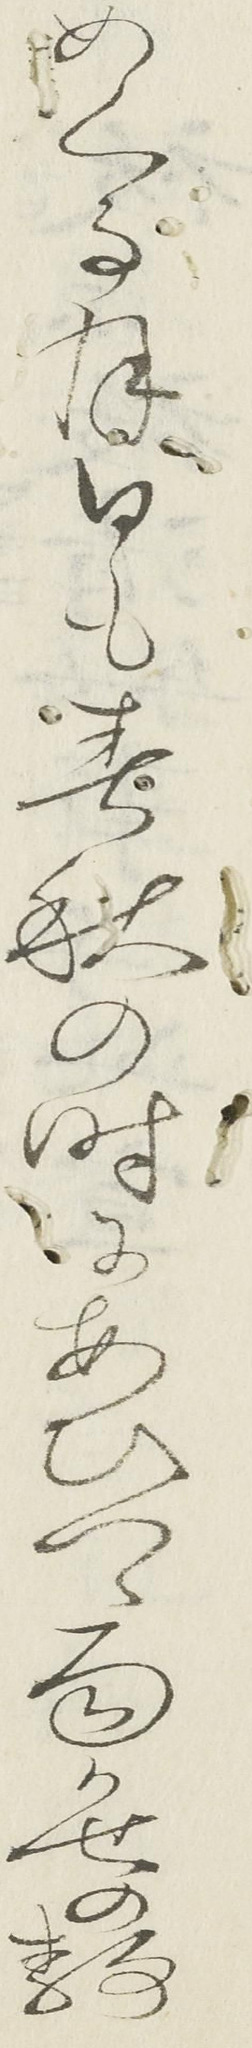めくる月日も春秋の時にあひつゝ雨かせの静
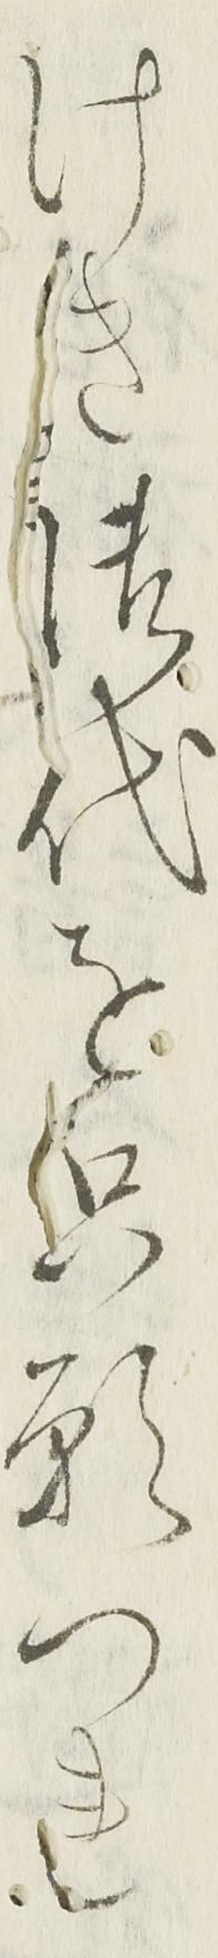けき御代を只願つれ
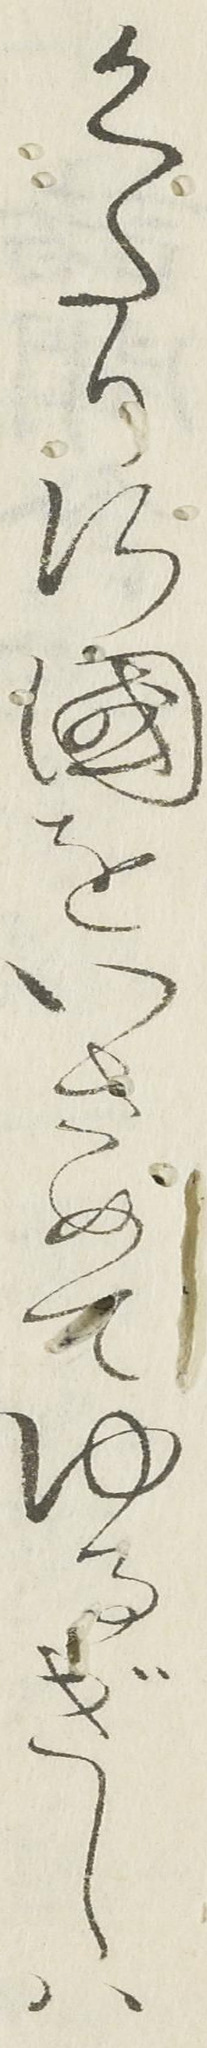くたり御？国をいさめてゆるぎしは
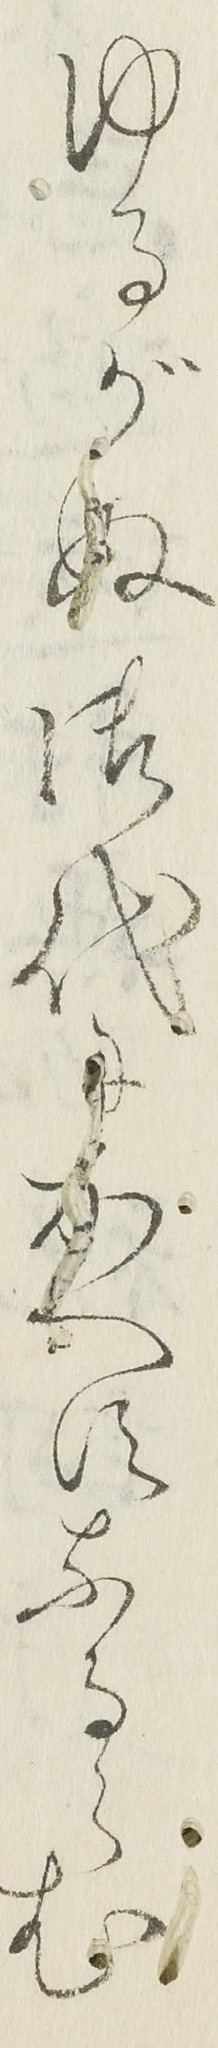ゆるがぬ御代にかへすなるらむ

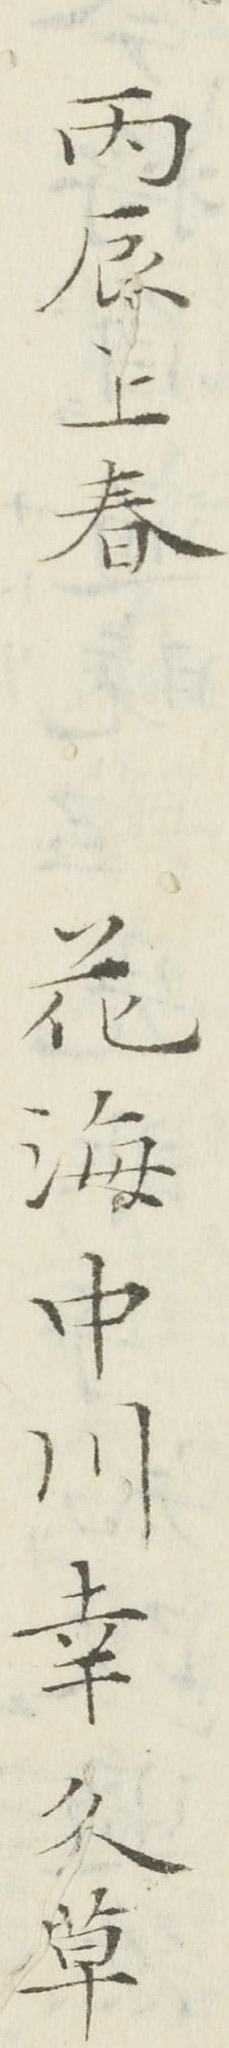丙辰上春花海中川幸久草
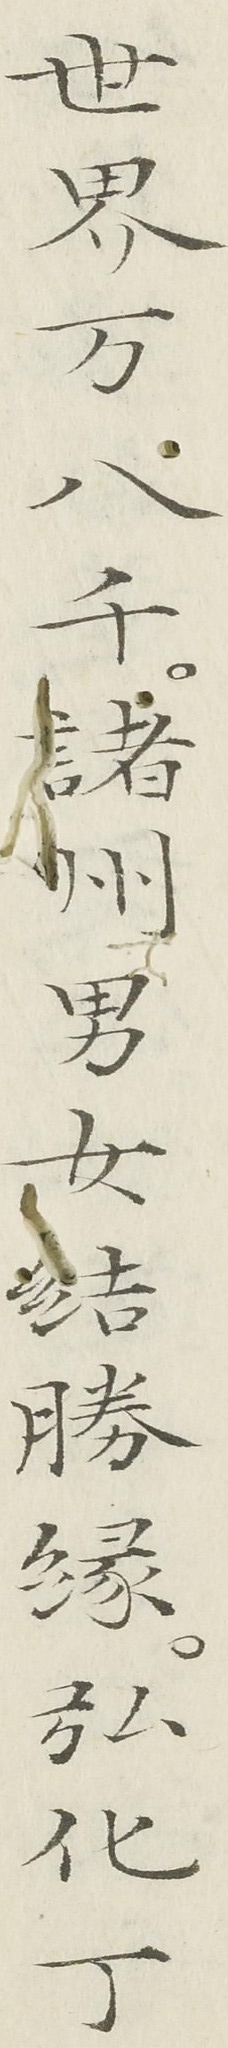世界万八千。諸州男女結勝縁。弘化丁
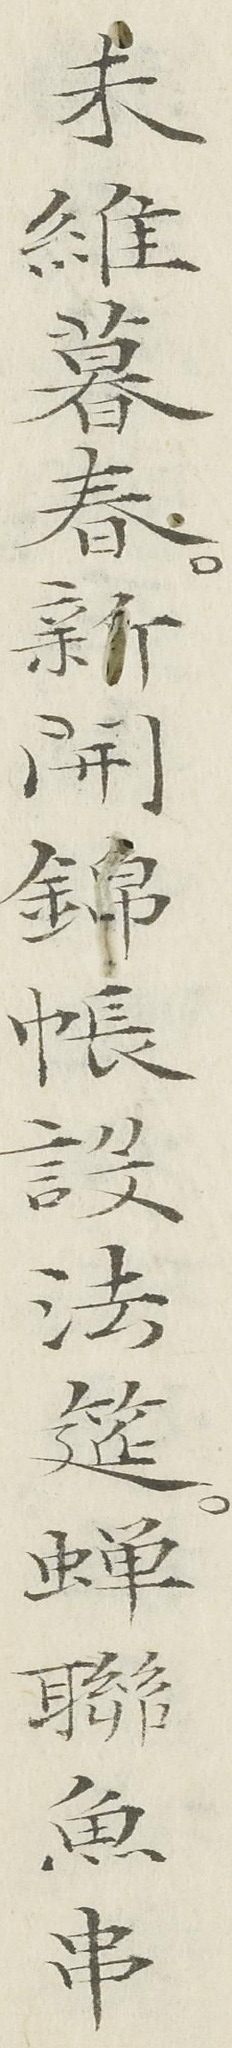未維暮春。新開錦張設法筵。蝉聯魚串
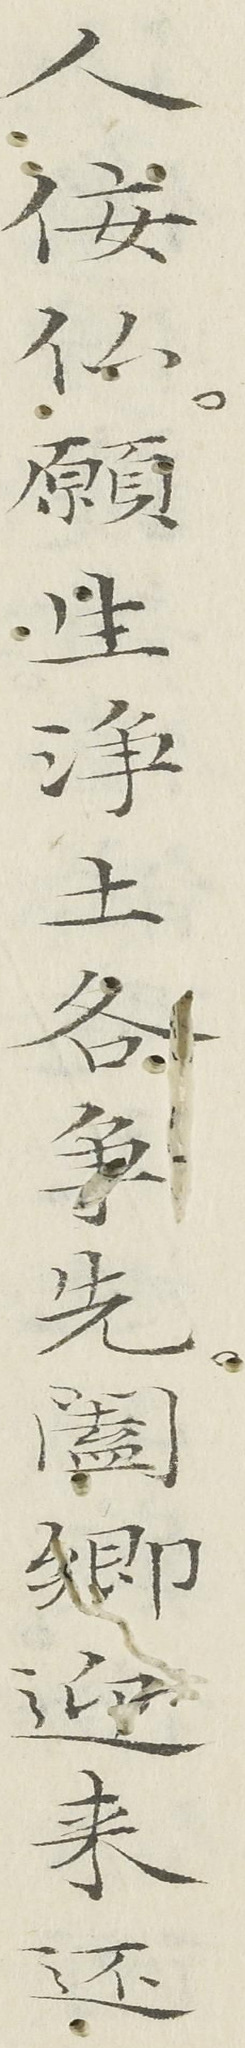人侒仏。願生浄土各争先。闔郷迎未还
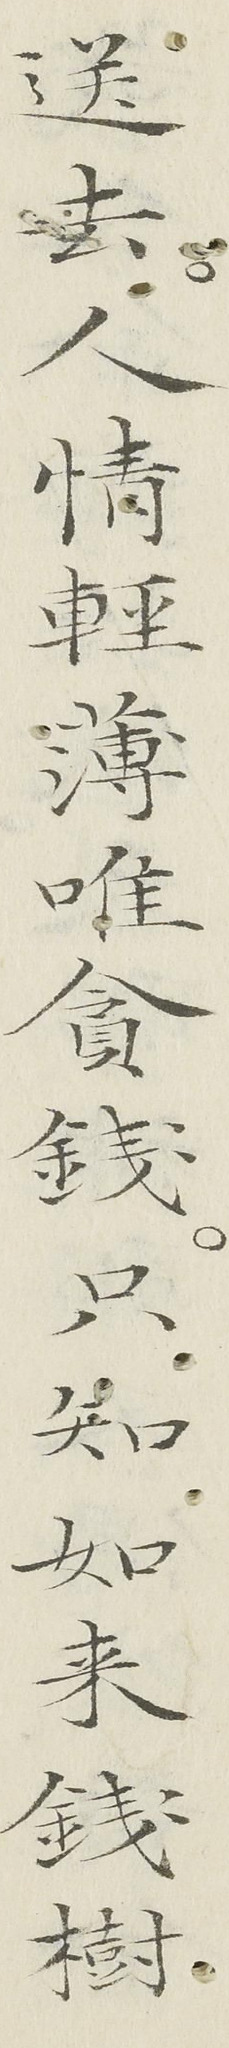送去。人情軽薄唯貪銭。只知如来銭樹
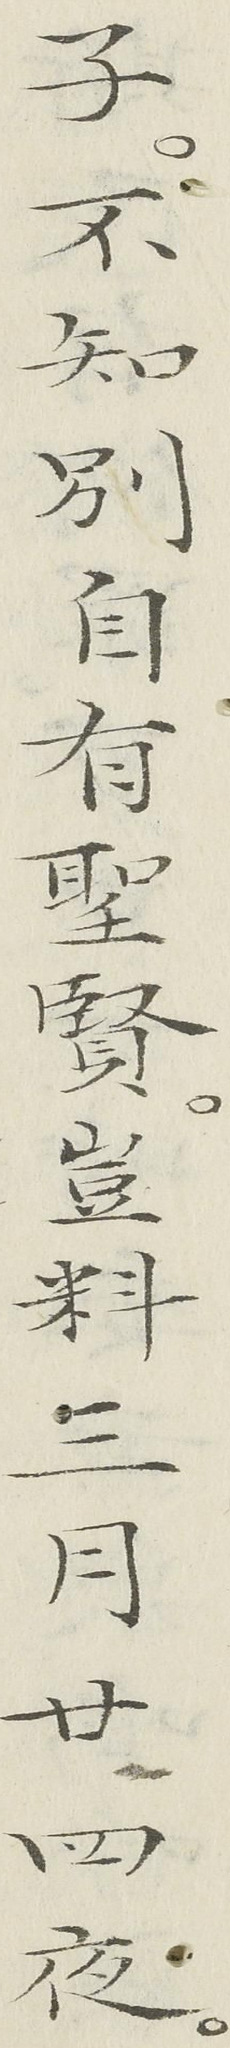子。不知別自有聖賢。豈料三月廿四夜。
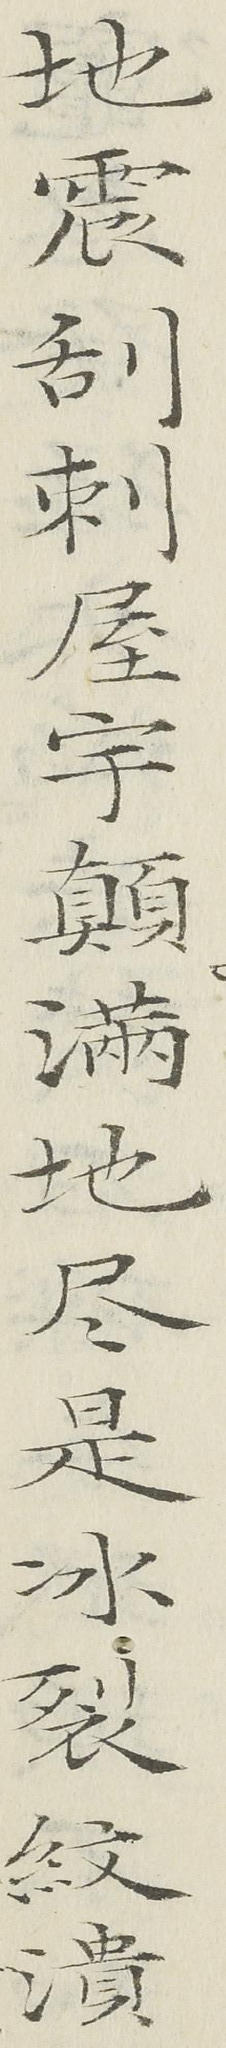地震刮刺屋宇顛。満地尽是水裂紋潰

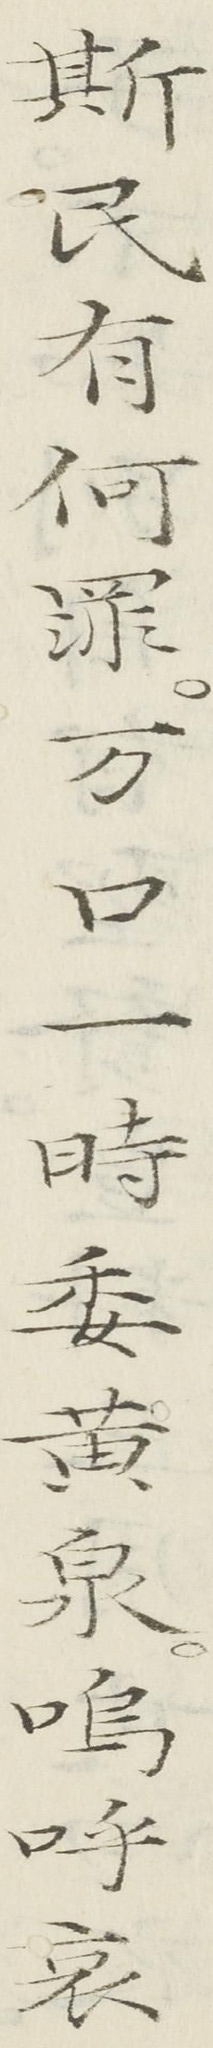斯民有何罪。万口一時委黄泉。鳴呼哀
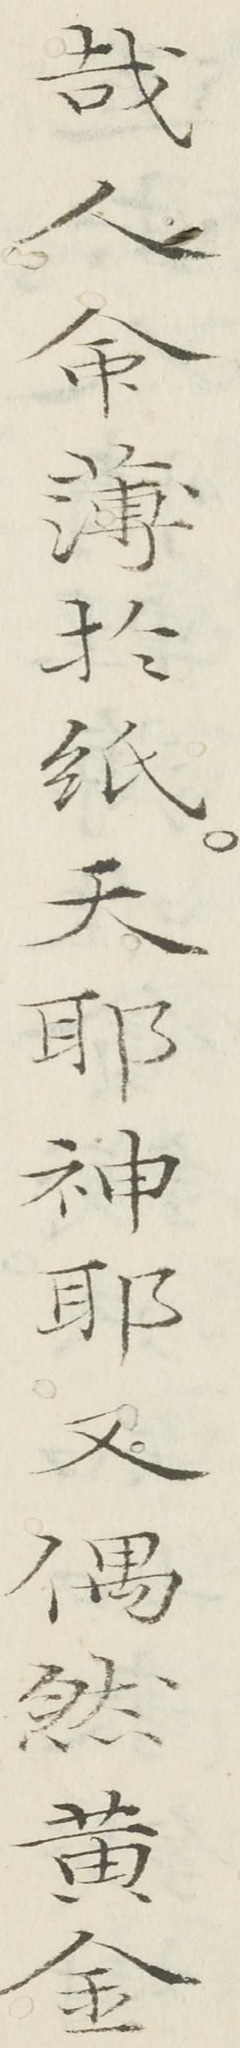哉人命薄於紙。天耶神耶又偶然黄金
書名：地震考證　全
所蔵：東京大学地震研究所図書室 Earthquake Research Institute Library, The University of Tokyo, JAPAN
